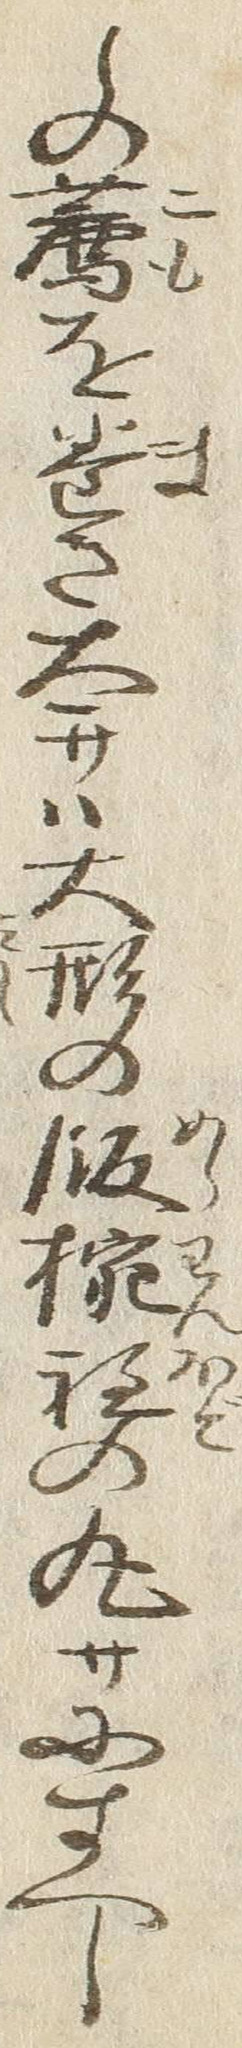しの薦を巻き太サは大形の飯椀程の丸サ尓すへし
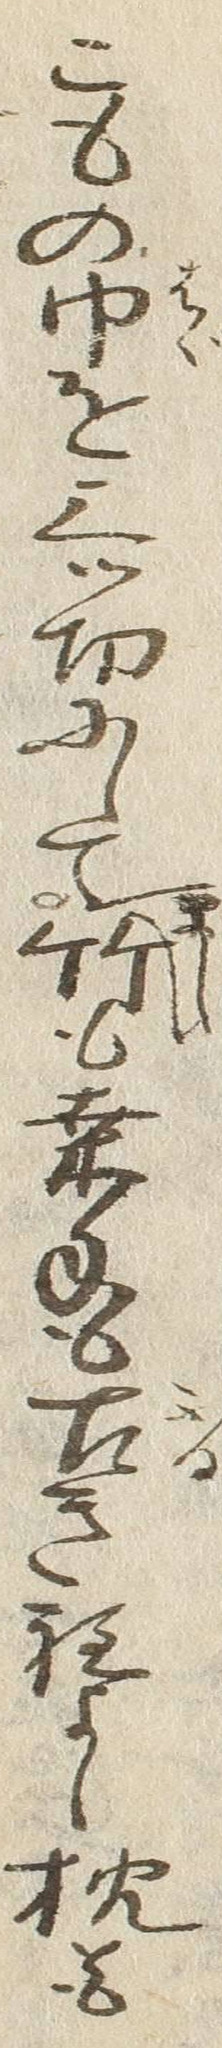こもの巾を三ツ切尓して。与し竹も桑手も古き程よし枕とも
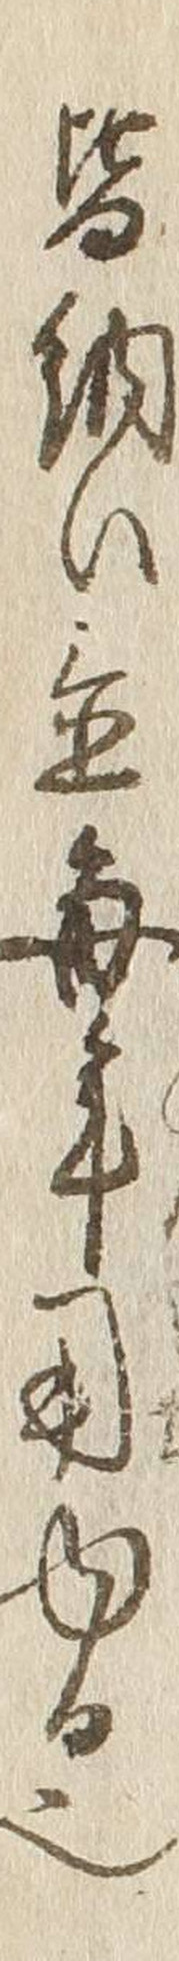皆納い置毎年用ゆる也
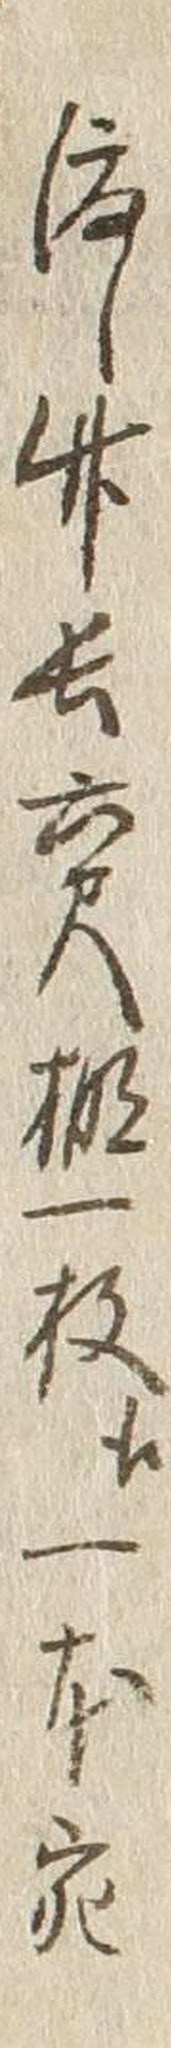渡し竹長六尺棚一枚江一本宛

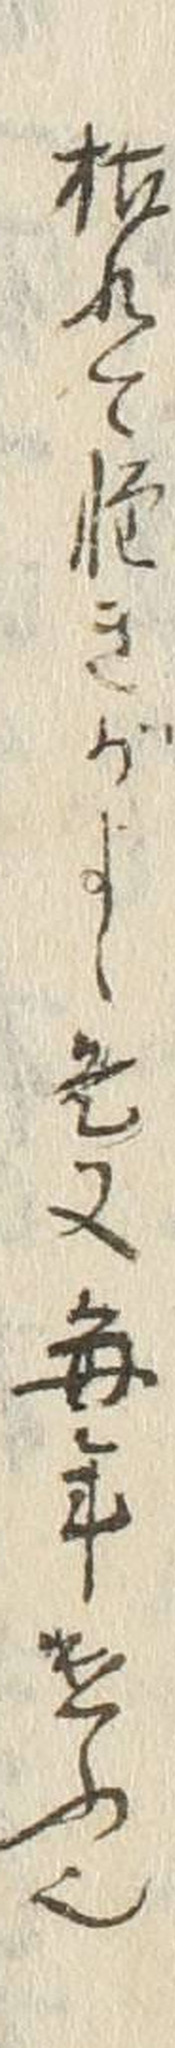枯れて軽きがよし是又毎年遣ふ也
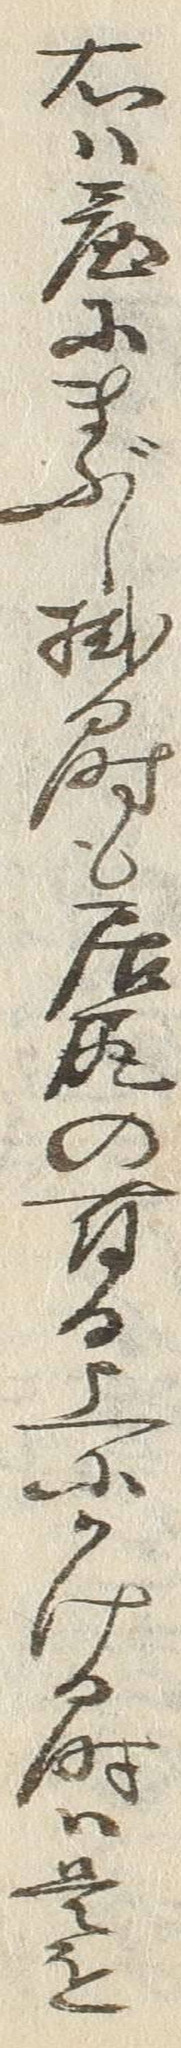右は臺尓まぶし掛る時も居尻の有る上尓かける時は是を
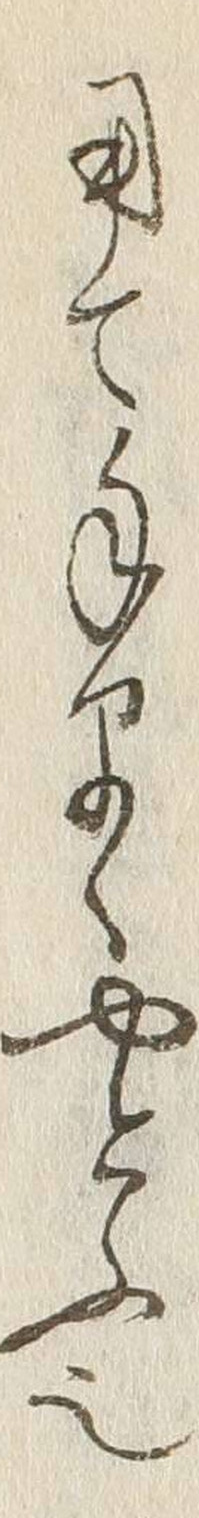用て手早くやとふ也
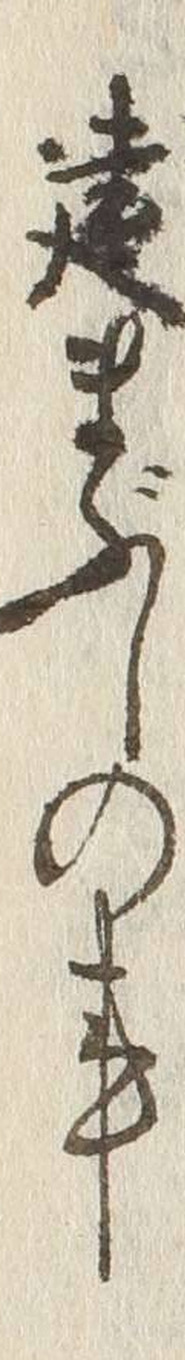建まぶしの事
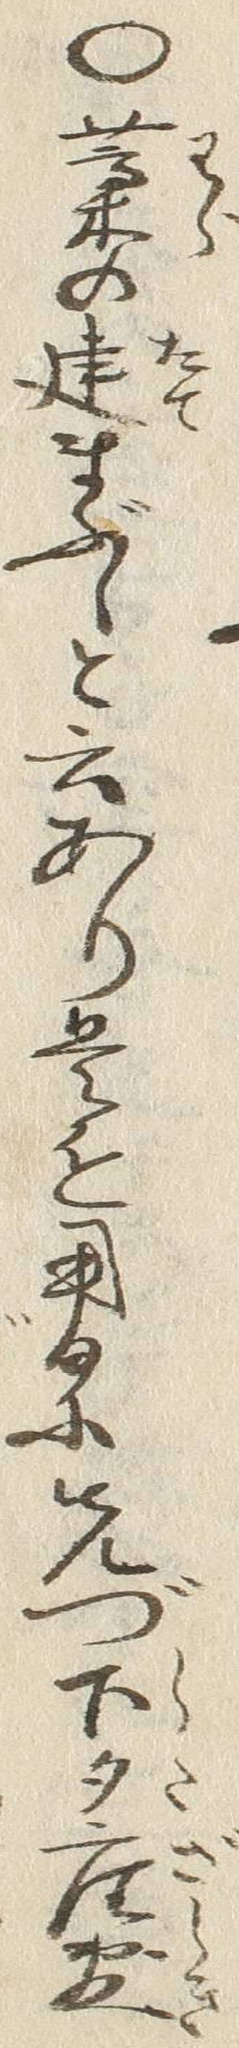〇藁の建まぶしと云あり是を用る尓先づ下タ座敷
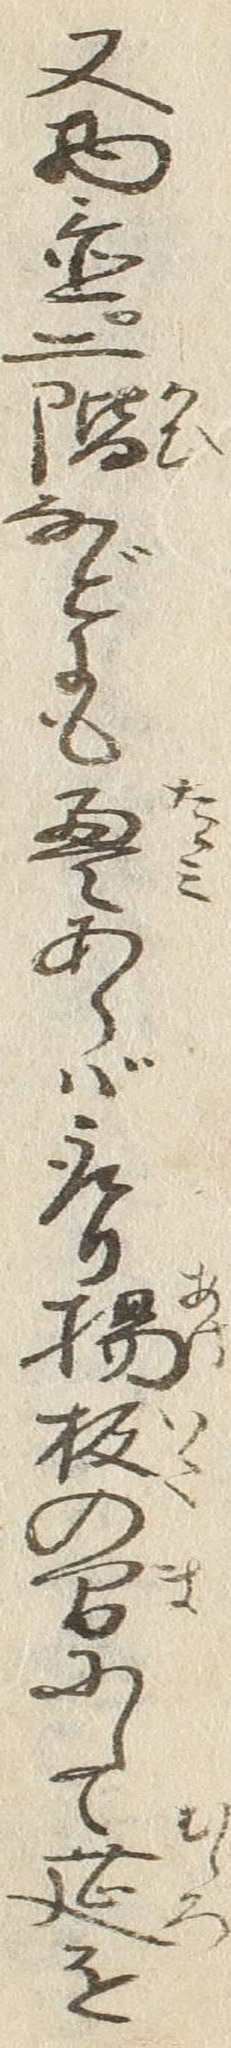又物置。二階など尓も畳あらば取り揚板の間尓して筵を
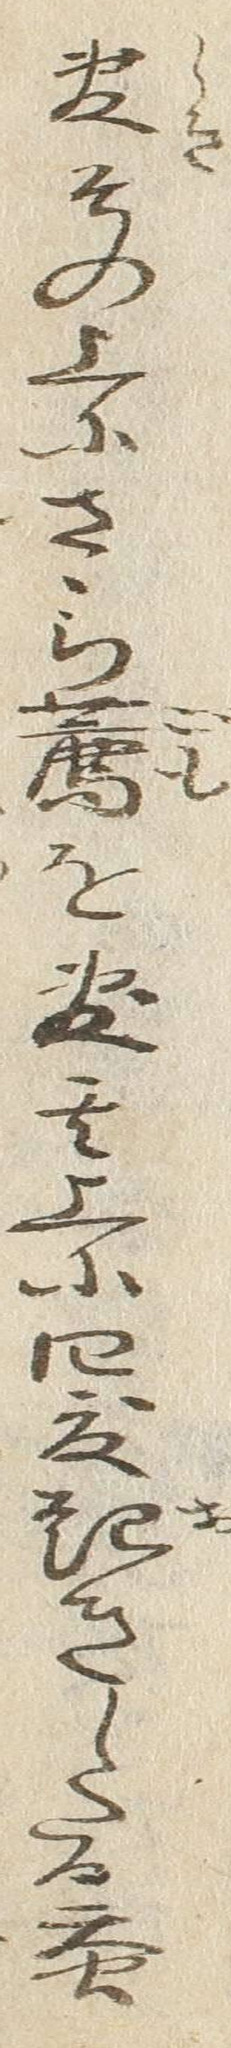敷その上尓さゝら薦を敷其上尓四度起きしたる蚕
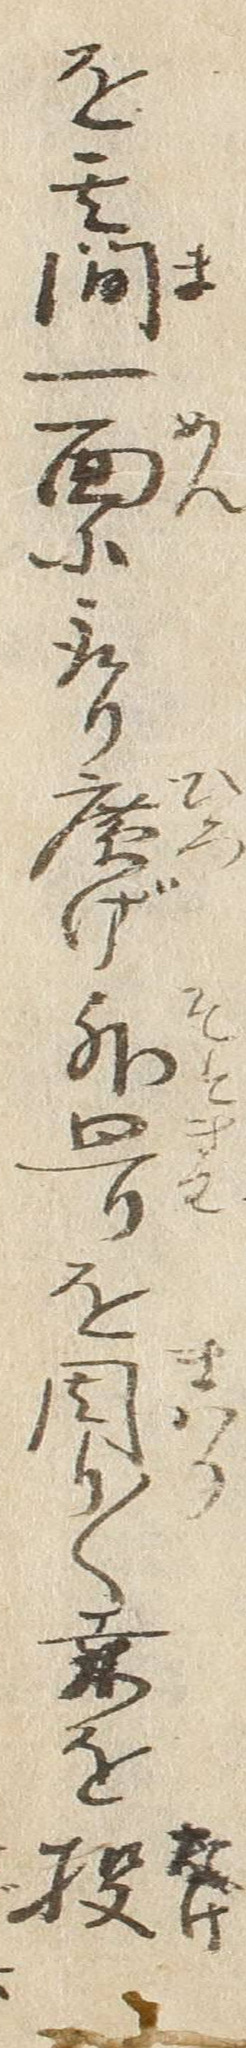を其間一面尓取り廣げ外廻りを周り〳〵桑を投

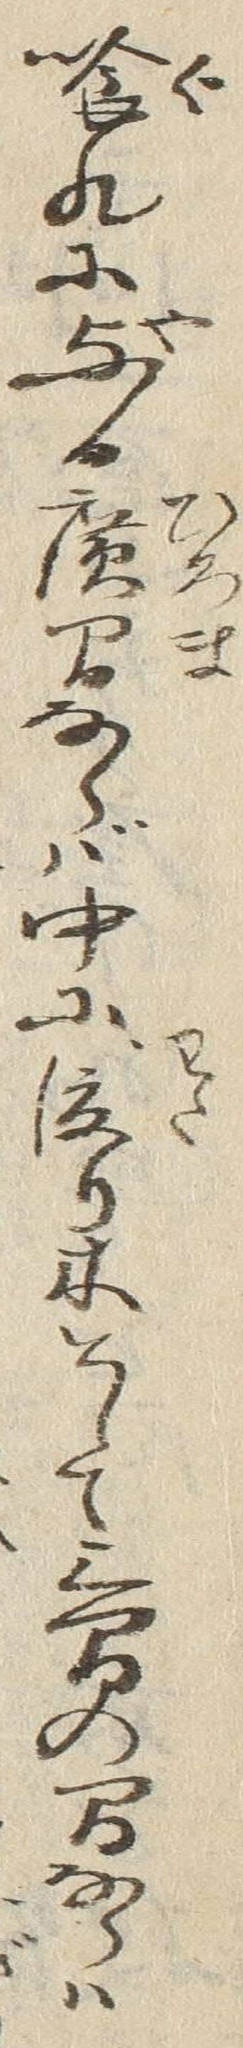喰れ尓与る廣間ならば中尓渡り木として三間の間ならは
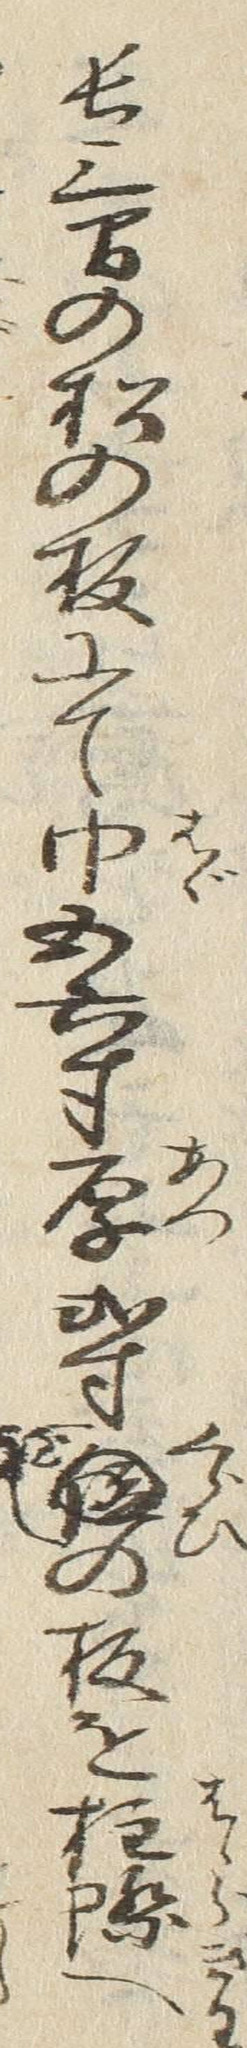長三間の松の板尓て巾五六寸厚弐寸程の板を柱際へ
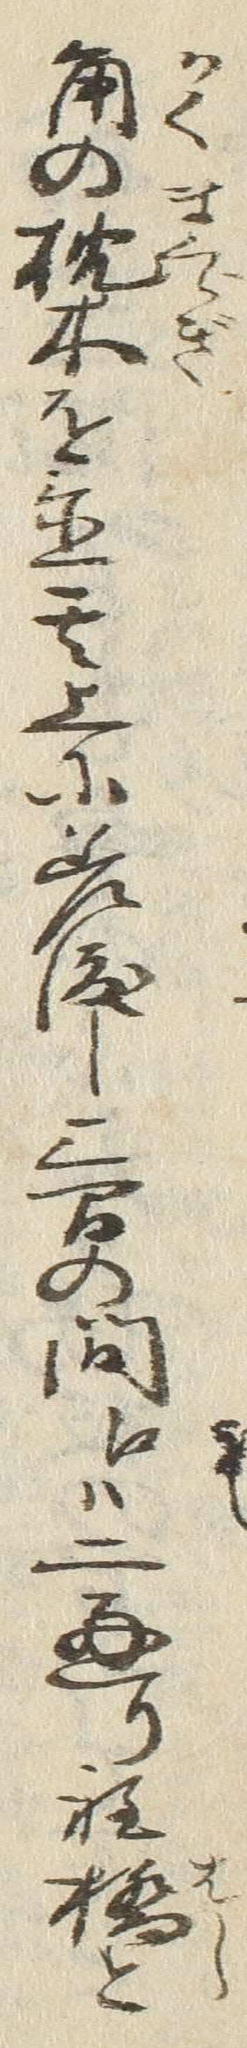角の枕木を置其上尓差渡し三間の間江は二通り程橋と
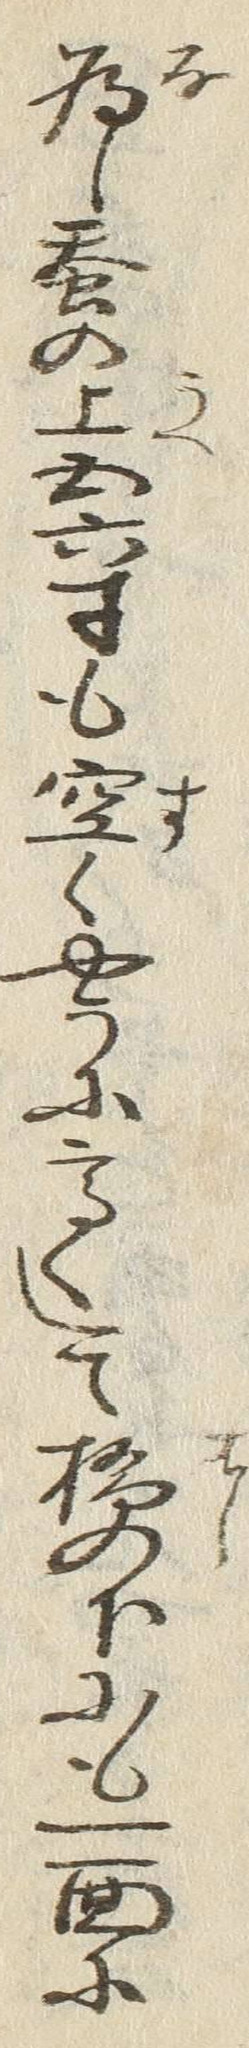為し蚕の上五六寸も空くやう尓高くして橋の下尓も一面尓
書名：養蠶實驗録後編
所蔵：東京大学農学生命科学図書館 国文学研究資料館
